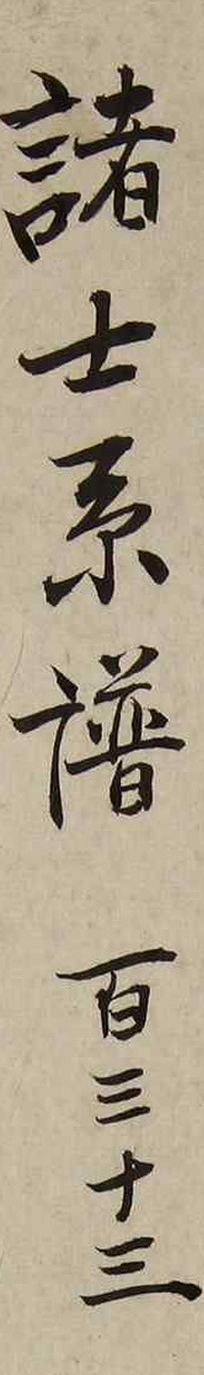諸士系譜百三十三

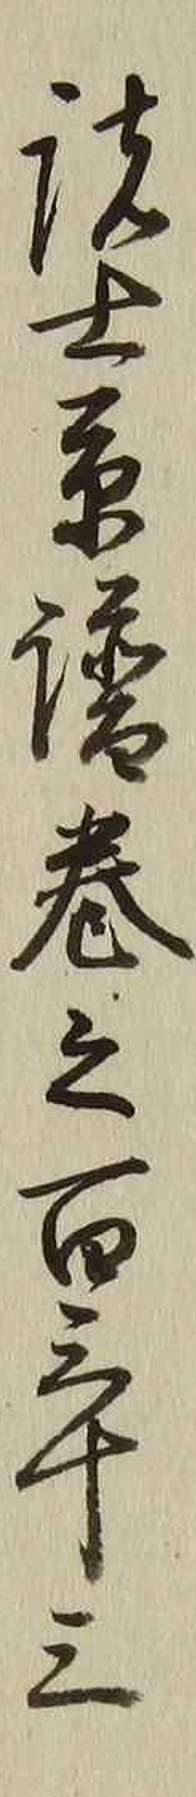諸士系譜巻之百三十三
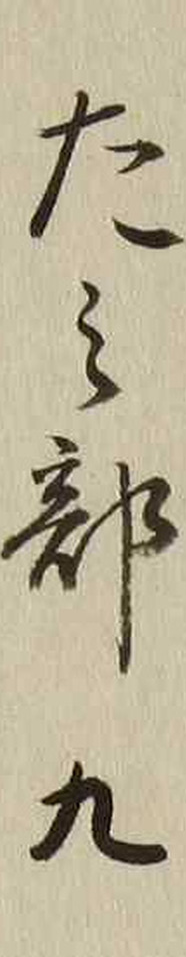た之部九
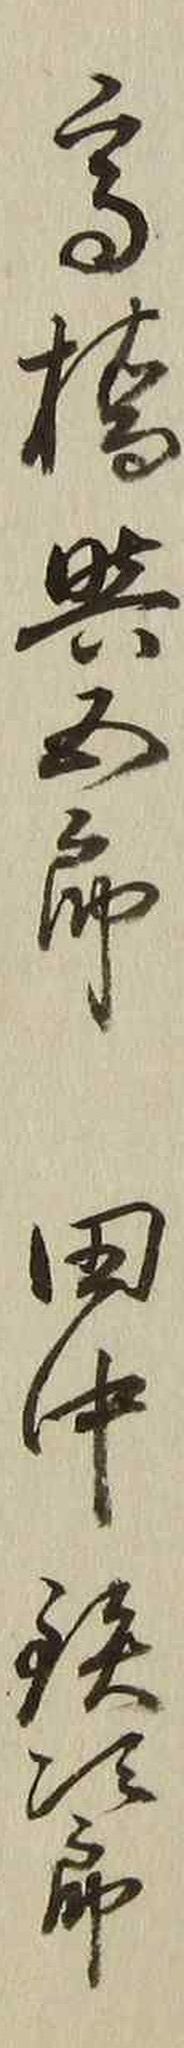高橋輿五郎田中鉄次郎
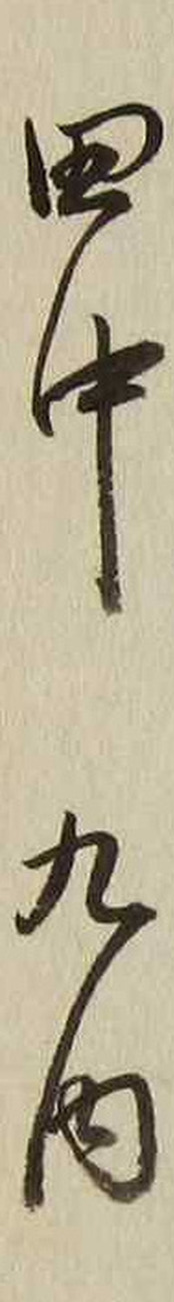田中九内
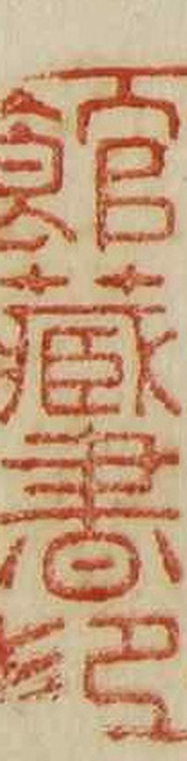館蔵書印

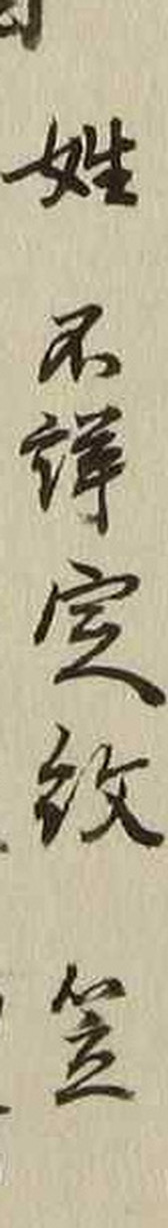姓不詳定紋笠
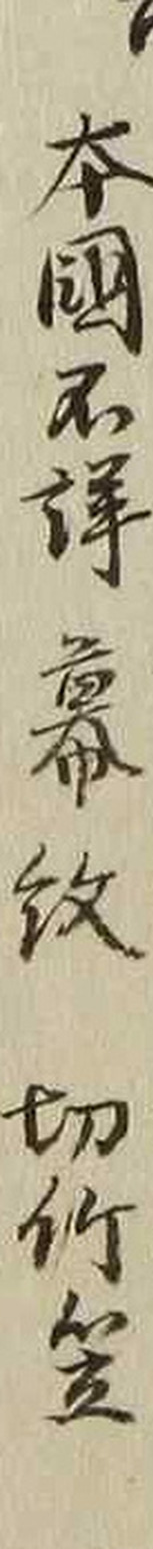本国不詳幕紋切竹笠
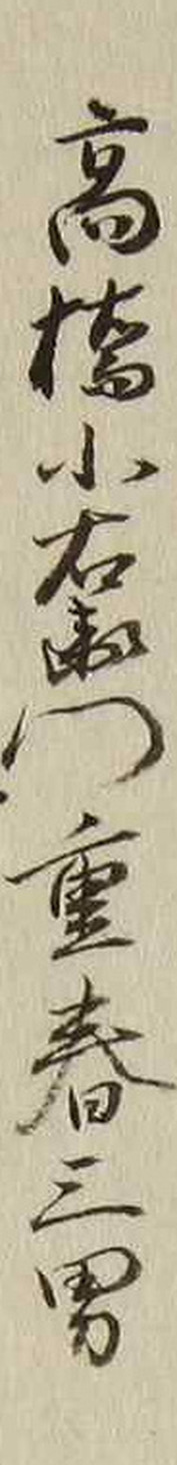高橋小右衛門重春三男
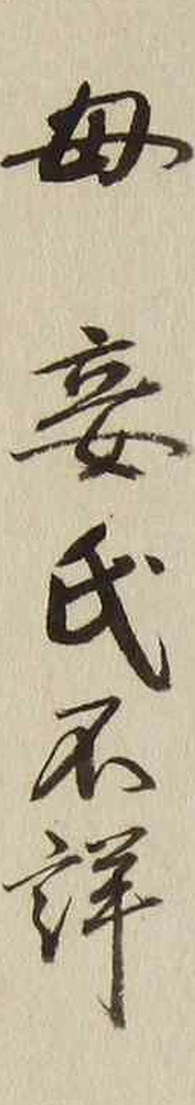母妾氏不詳
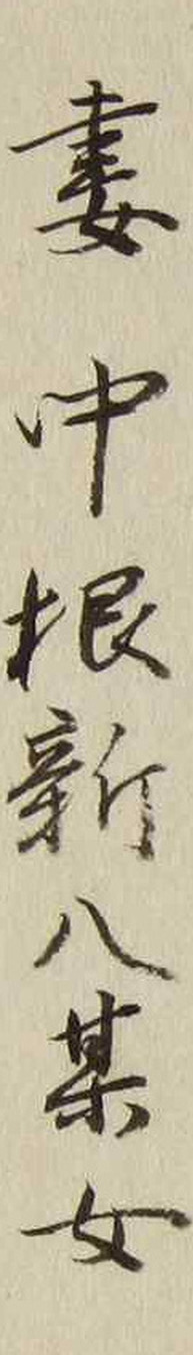妻中根新八某女
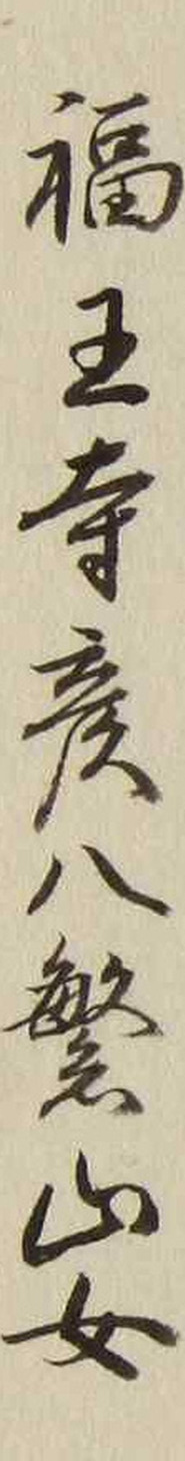福王寺彦八繁正女

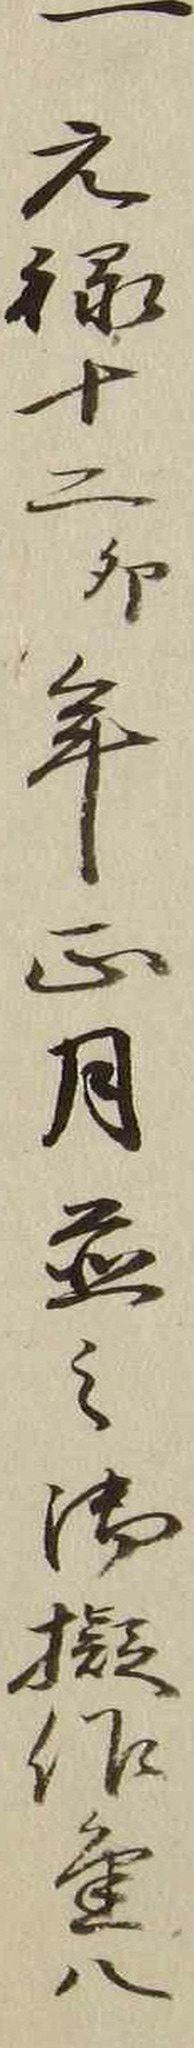一元禄十二卯年正月並之御擬作金八
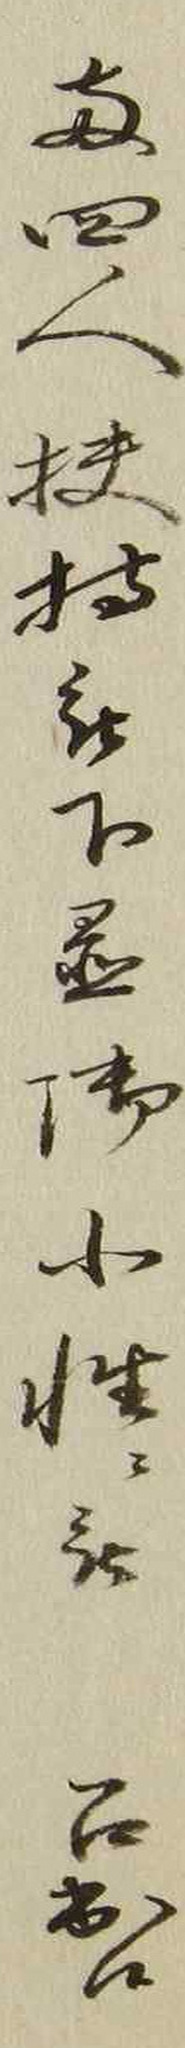両四人扶持被下置御小性に被召出候
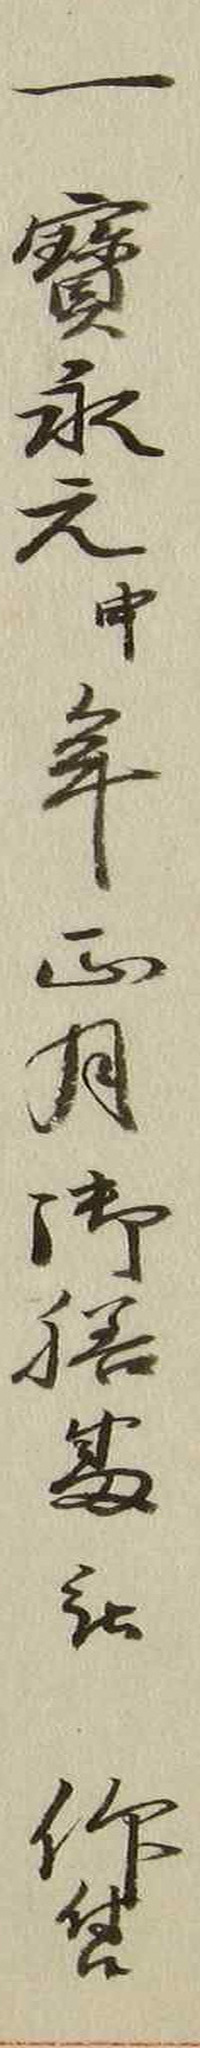一宝永元申年正月御膳番被仰付候
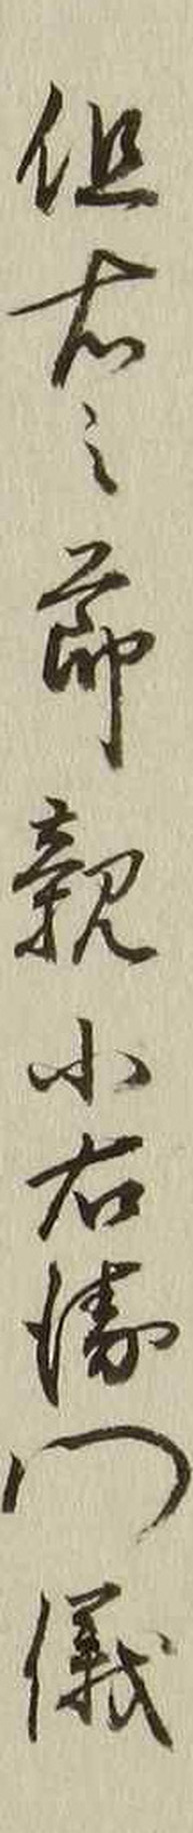但右之節親小右衛門儀
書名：諸士系譜　巻之133　た之部9
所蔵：会津若松市立会津図書館
